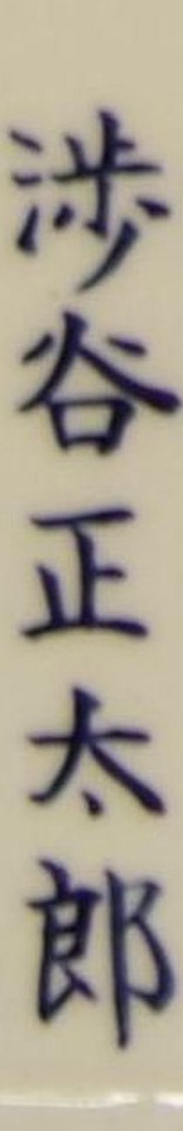渉谷正太郎
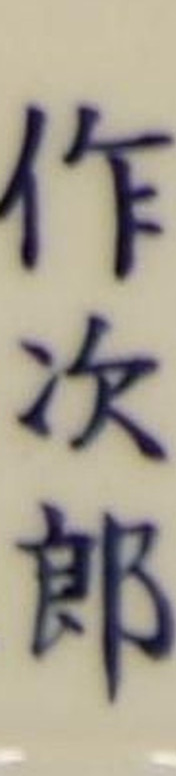作次郎

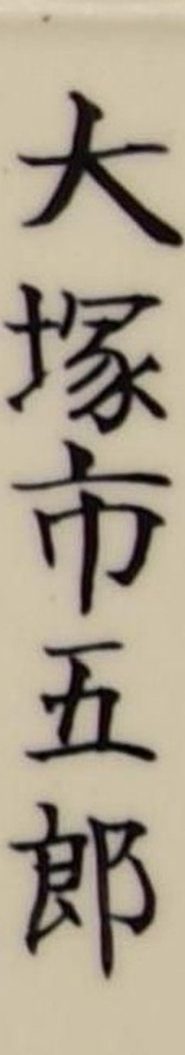大塚市五郎
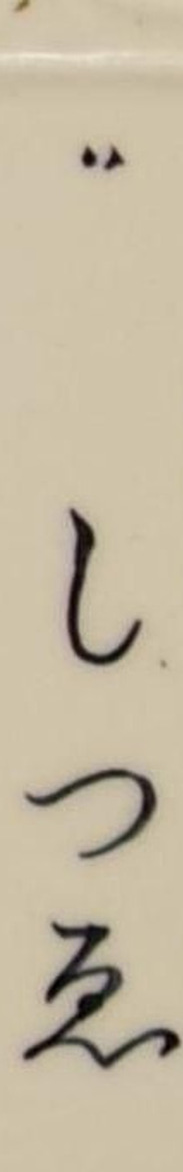しつゑ
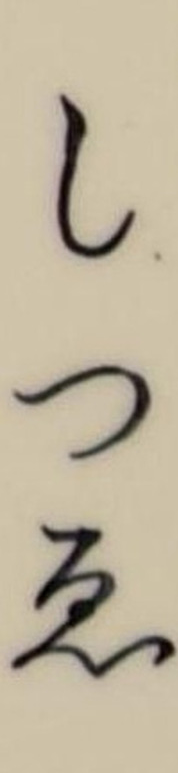しつゑ
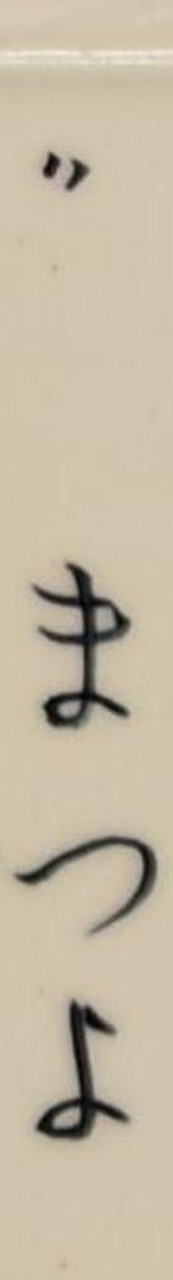まつよ
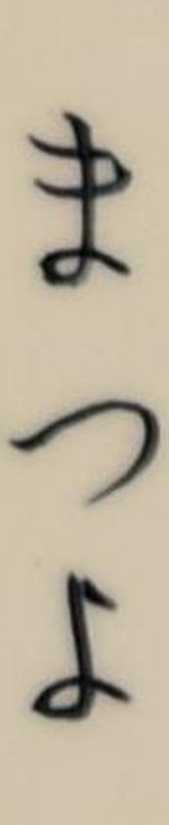まつよ
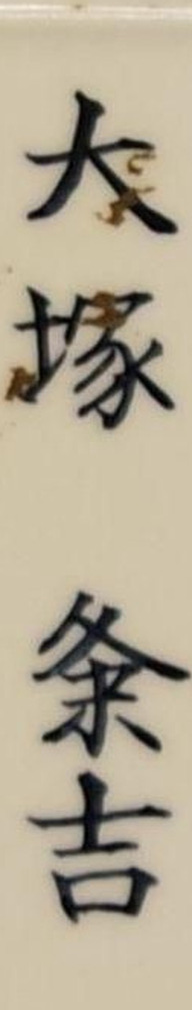大塚粂吉
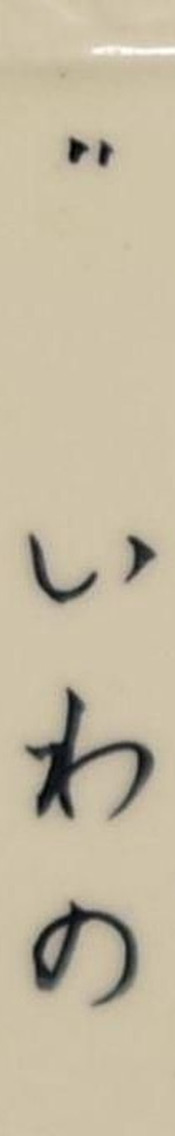いわの
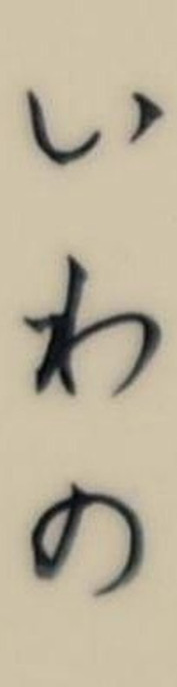いわの
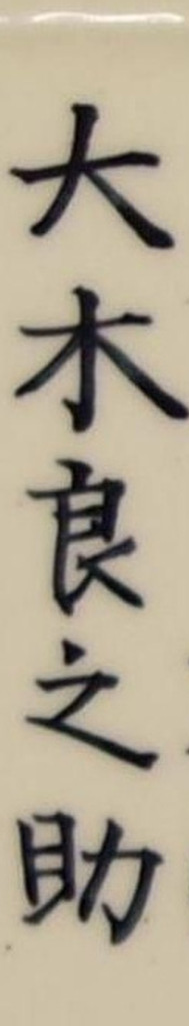大木良之助
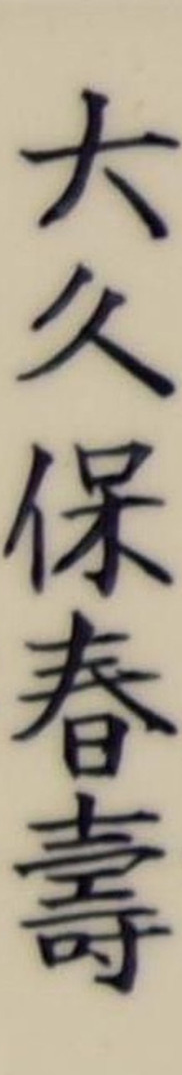大久保春壽
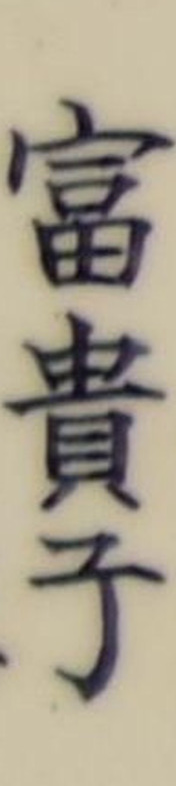富貴子

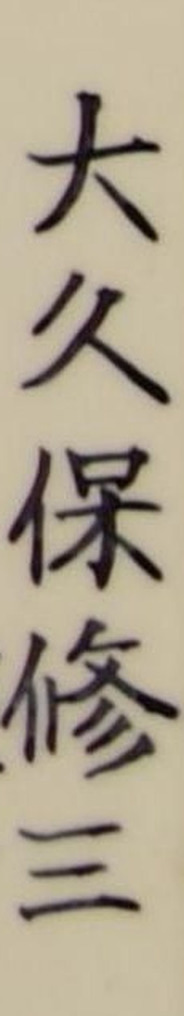大久保修三
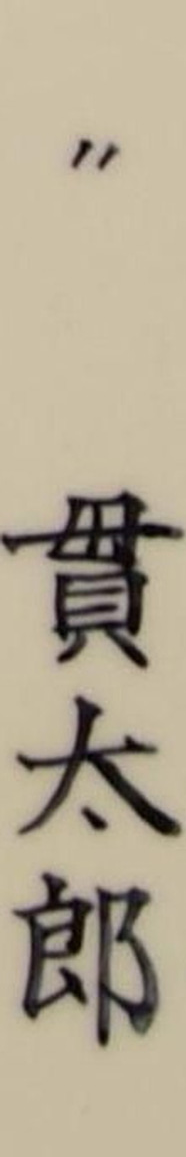貫太郎
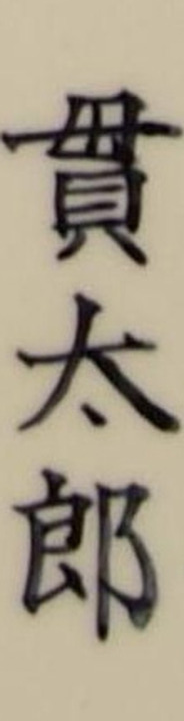貫太郎
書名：A~D
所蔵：koyasan kongobuji
